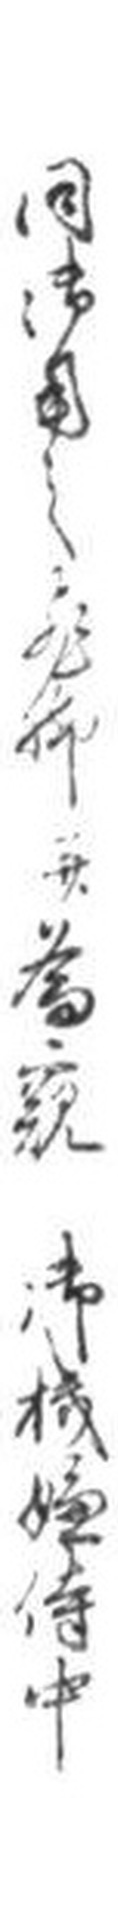同御用之飛脚并為窺御機嫌侍中
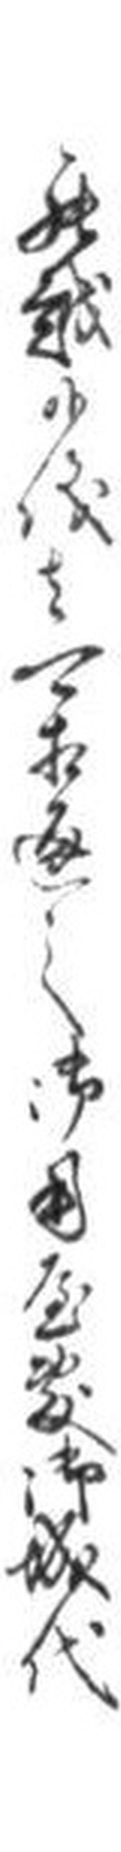罷越候儀者可相通之御用屋敷御城代
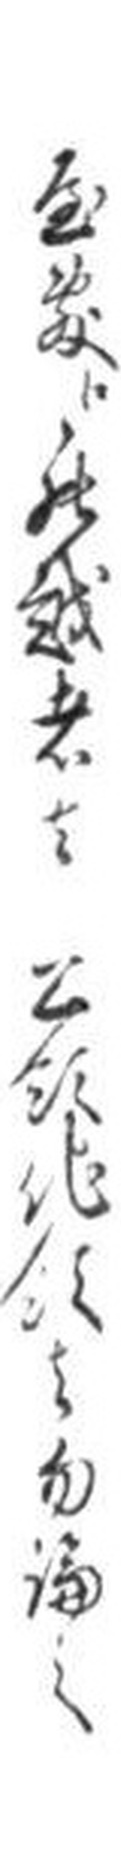屋敷江罷越者者公領他領者勿論之
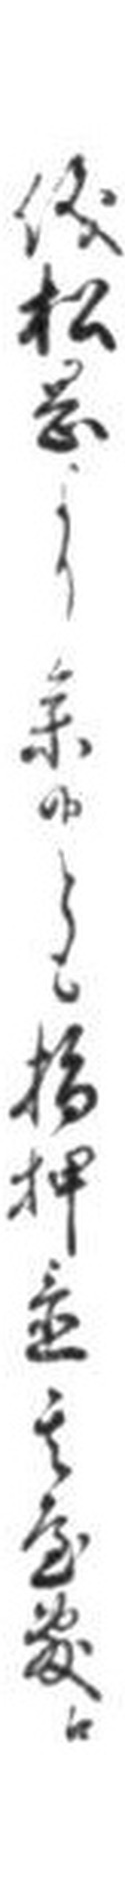儀松岡より参候とも指押置其屋敷江
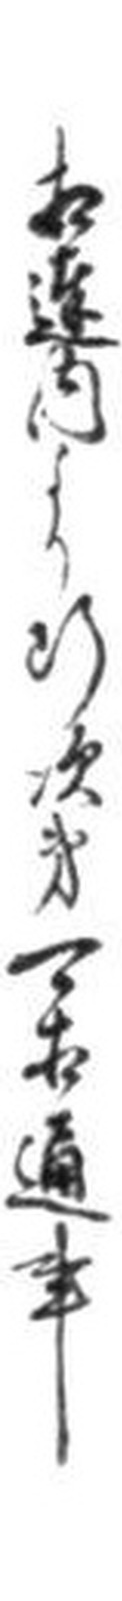相達内より断次第可相通事
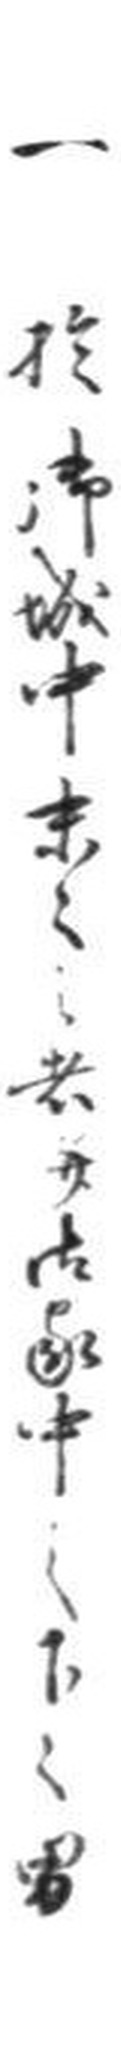一於御城中末々之者并御家中之下々男
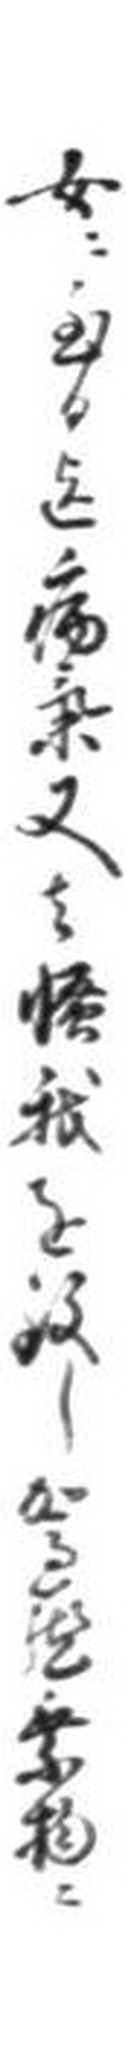女ニ至る迄病気又者怪我を致し駕籠乗物ニ
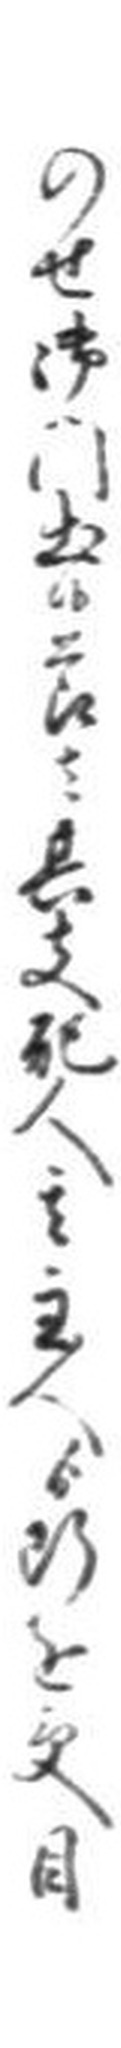のせ御門出候節者其支配人其主人ゟ断を受目
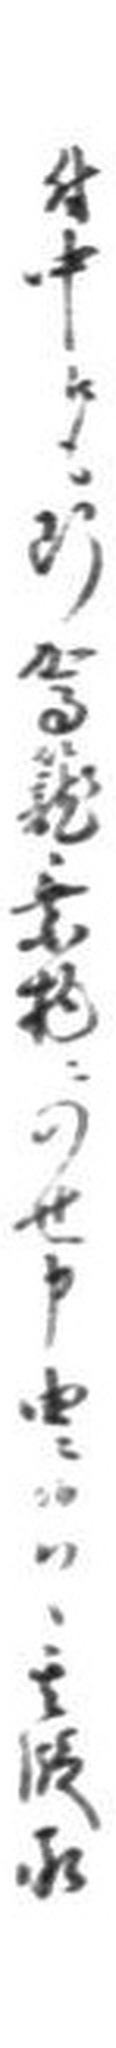付中江も断駕籠乗物ニのせ申由ニ候ハヽ其段承
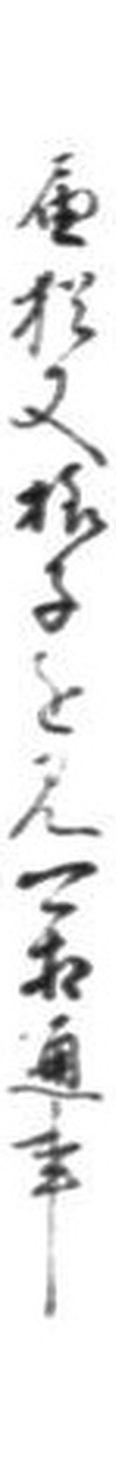届猶又様子を見可相通事
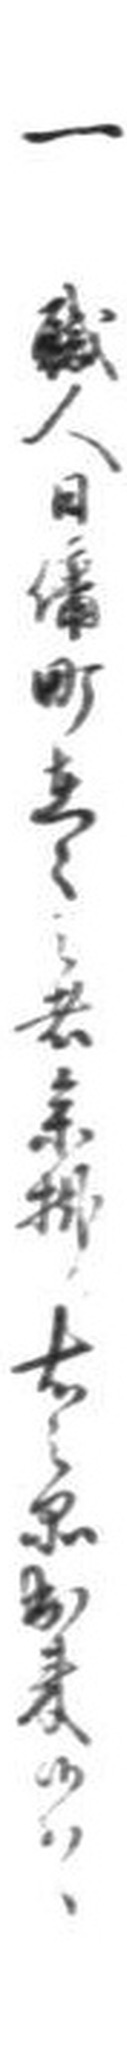一職人日傭町在々之者参掛り右之品出来候ハヽ
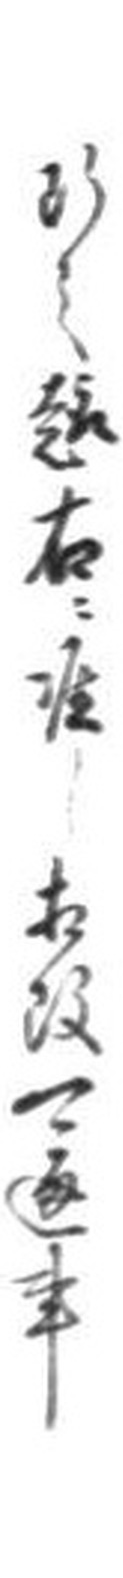断之趣右ニ准し相改可通事
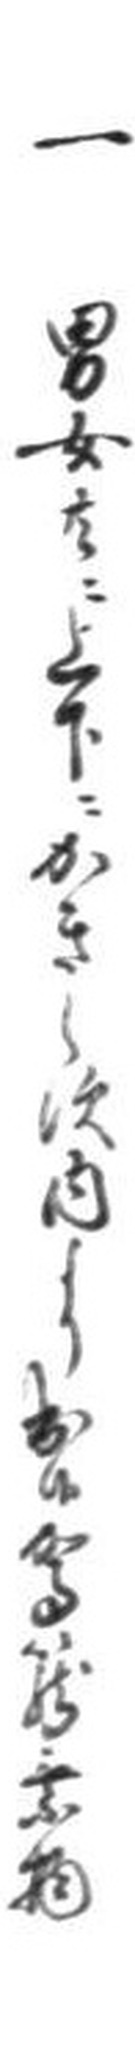一男女共ニ上下ニかきらす内より出候駕籠乗物
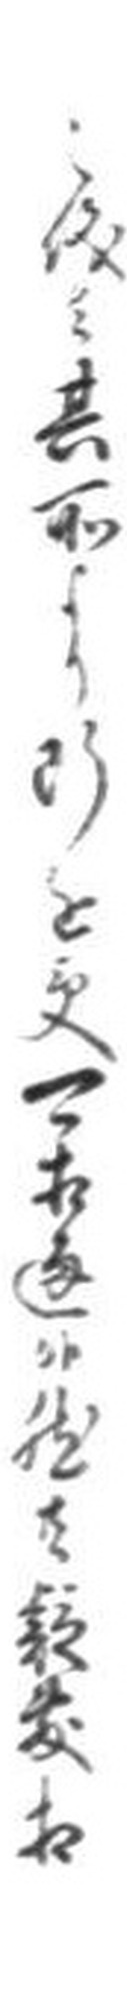之儀者其所より断を受可相通候然共疑敷相
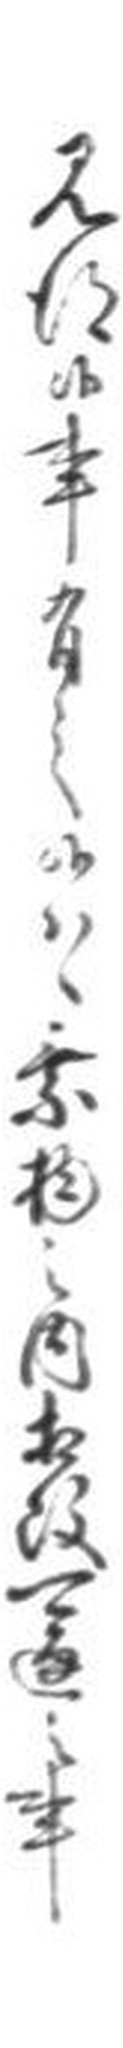見得候事有之候ハヽ乗物之内相改可通之事

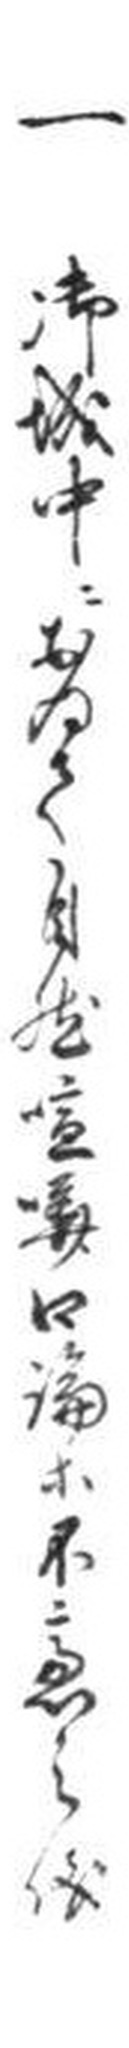一御城中ニおゐて自然喧嘩口論等不慮之儀
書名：家譜 三十三 吉邦公 享保四年
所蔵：福井県文書館 Fukui Prefectural Archives
